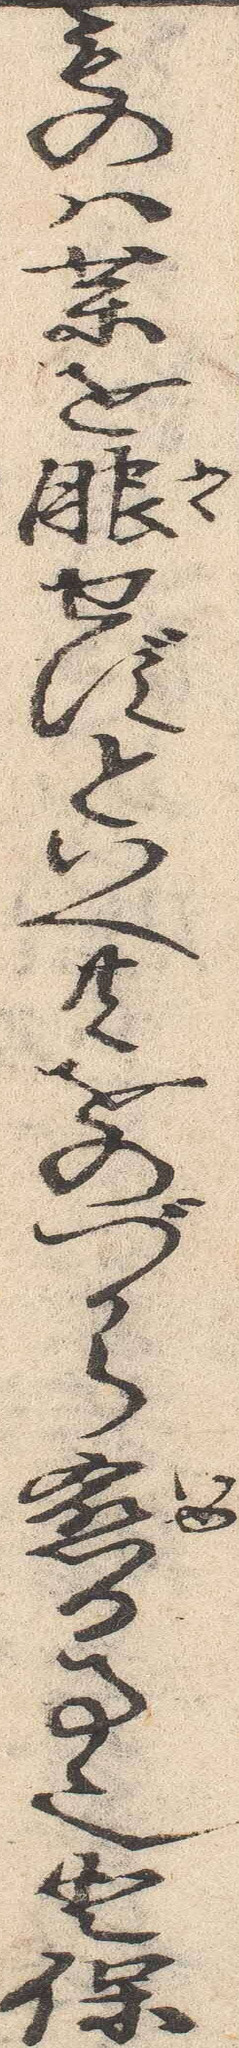ものは薬を服せずといへ共をのづから愈る事也と保
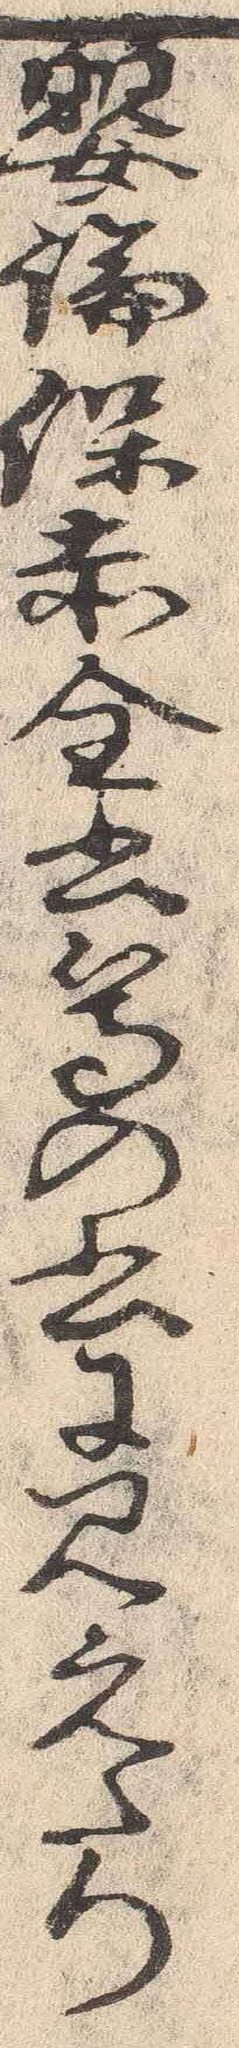嬰論保赤全書等の書に見えたり
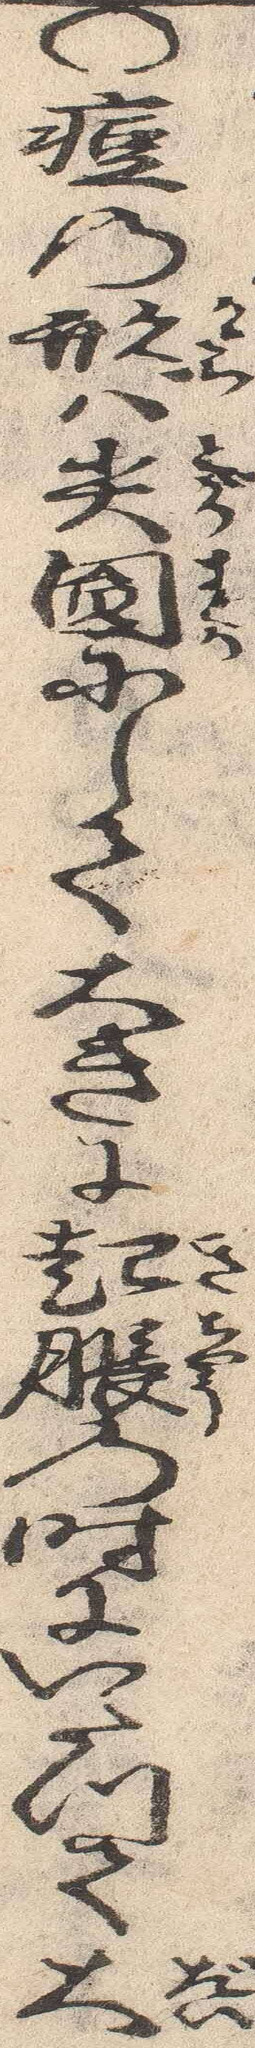○痘の形は尖円にして大きに起脹の時にいたつて大
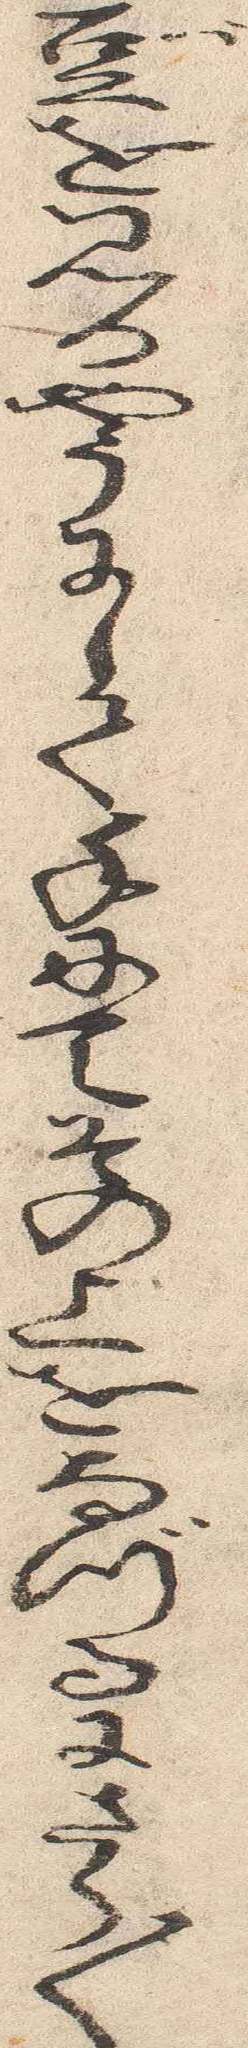豆を見るやうにして手にてその上をなづるにさら〳〵
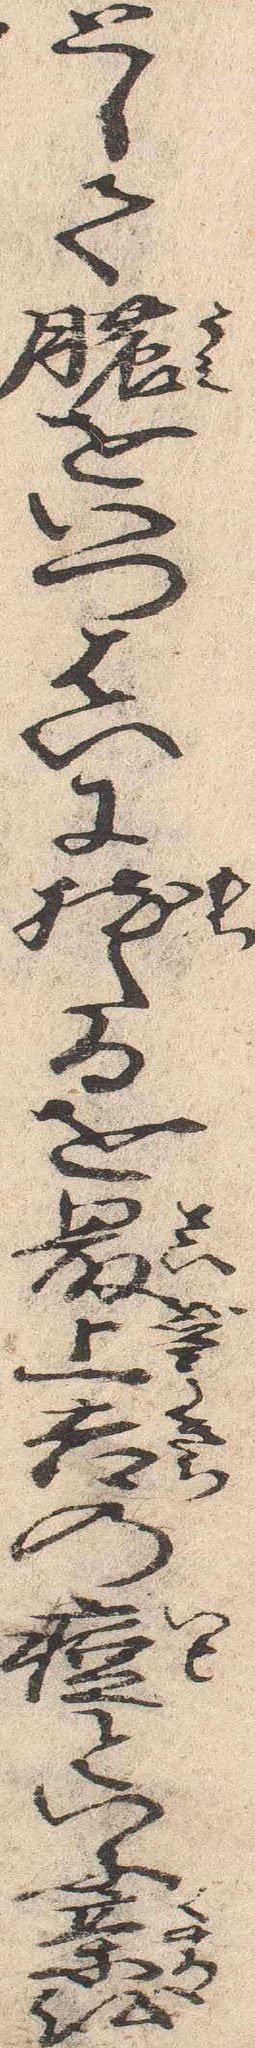として膿をいつはいに持たるを最上吉の痘といふ薬を
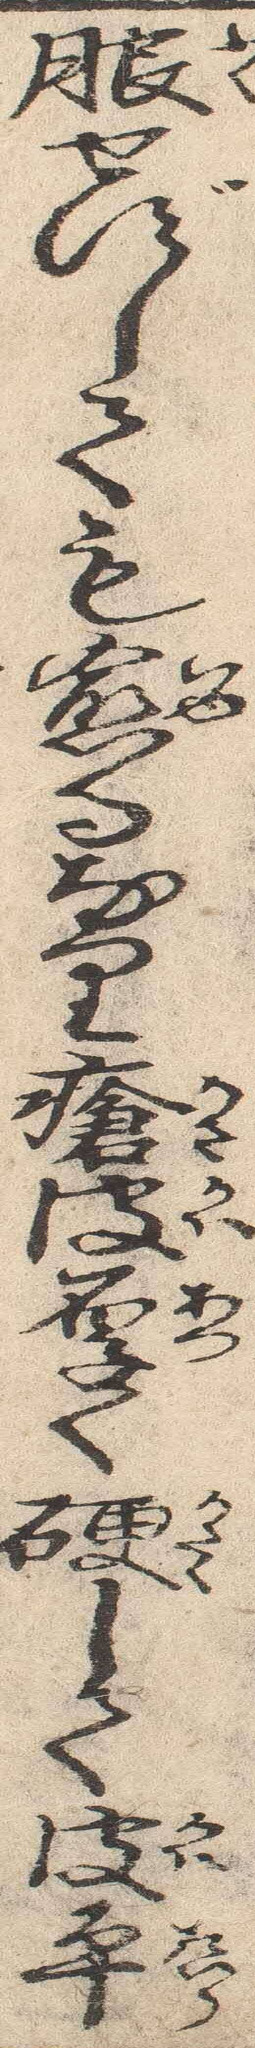服せずしても愈るなり瘡皮厚く硬して皮平
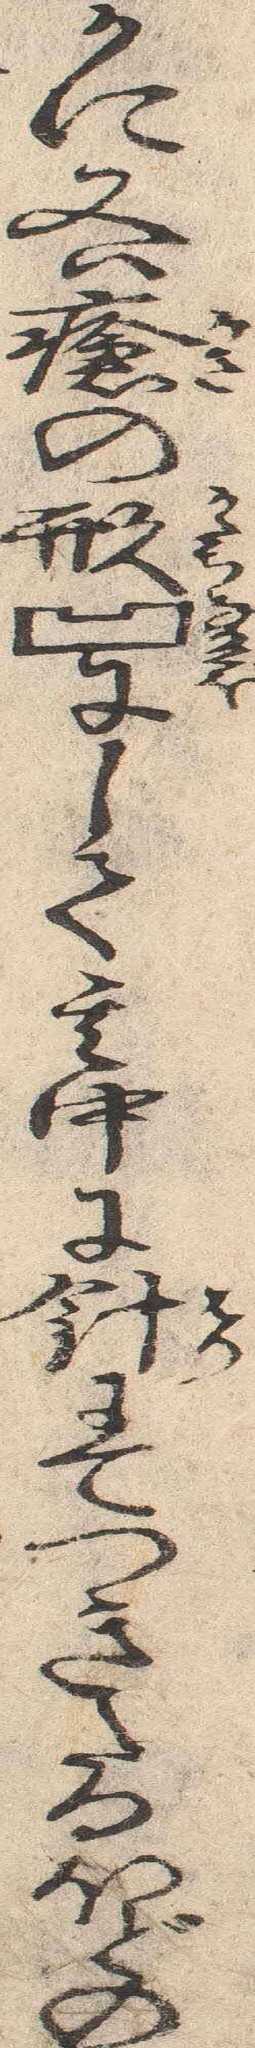かに又は瘡の形凹にして其中に針にてつきたるほどの
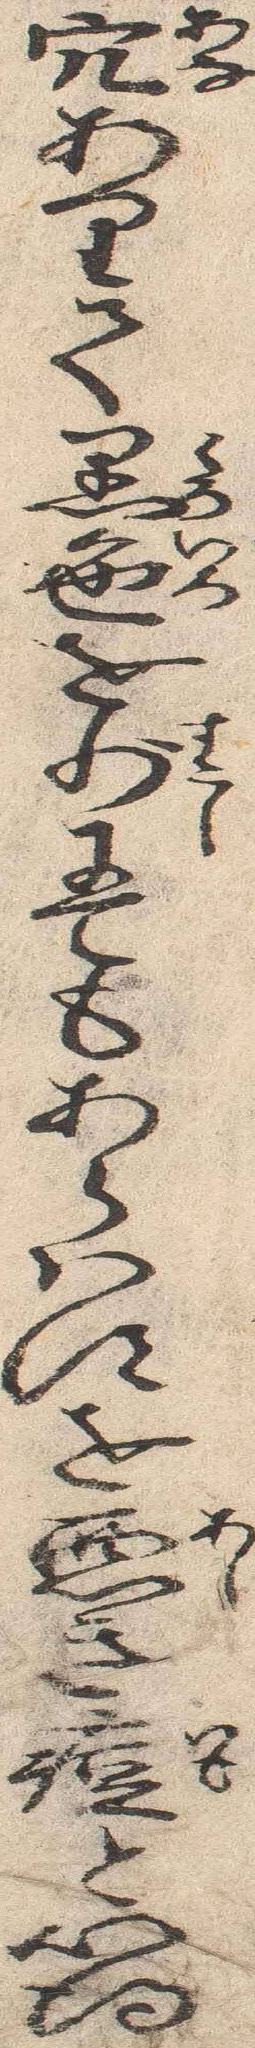穴ありて黒色を少にてもあらはすを悪き痘と心得
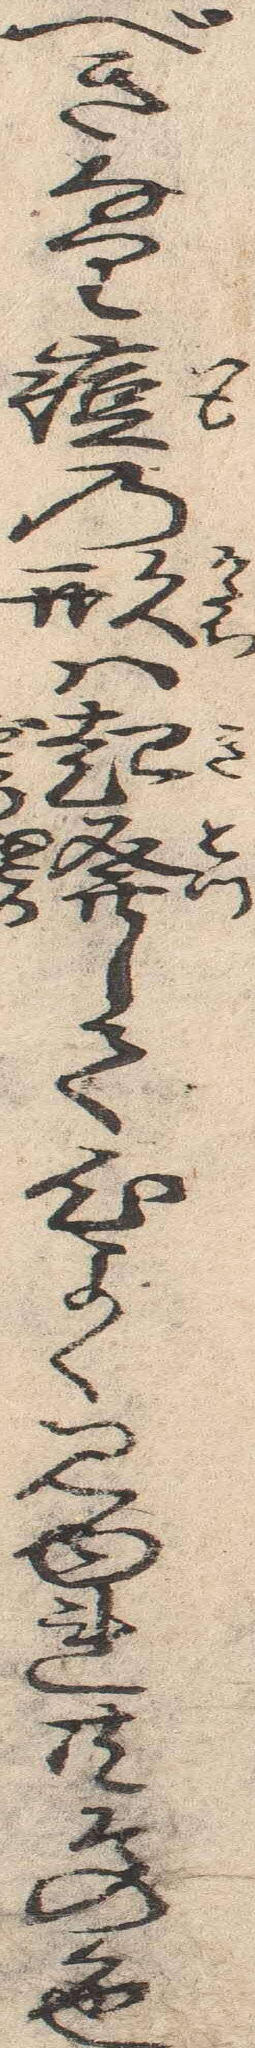べきなり痘の形は起発して心よく見ゆれ共その色
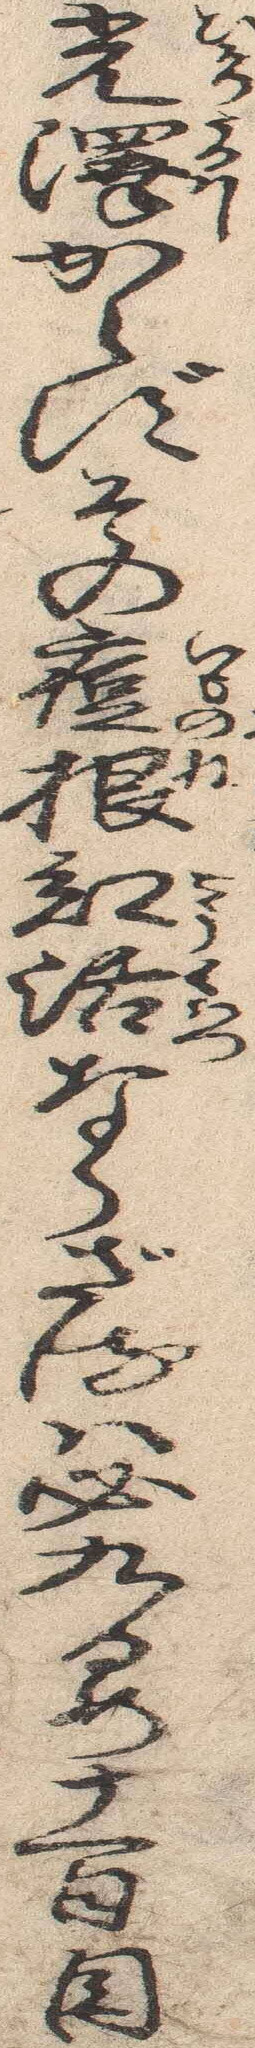光沢からずその痘根紅活ならざるは必九日め十一日目
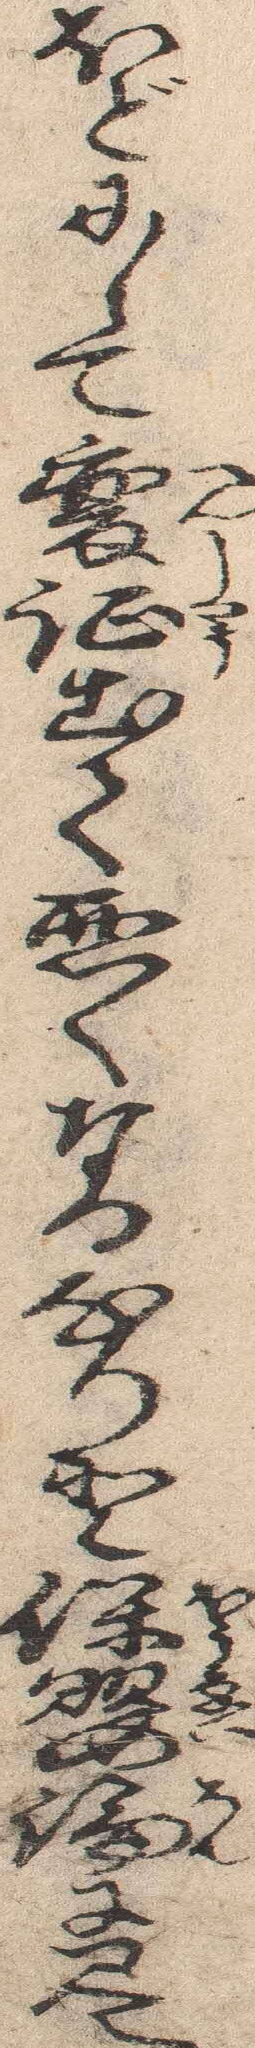ほどにして変症出て悪くなるなりと保嬰論に見え

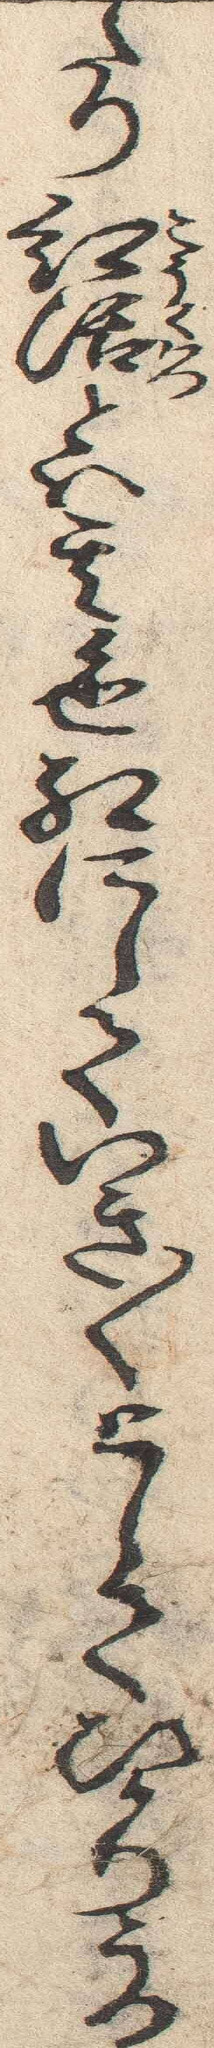たり紅活とは其色紅にしていき〳〵としてひかりうる
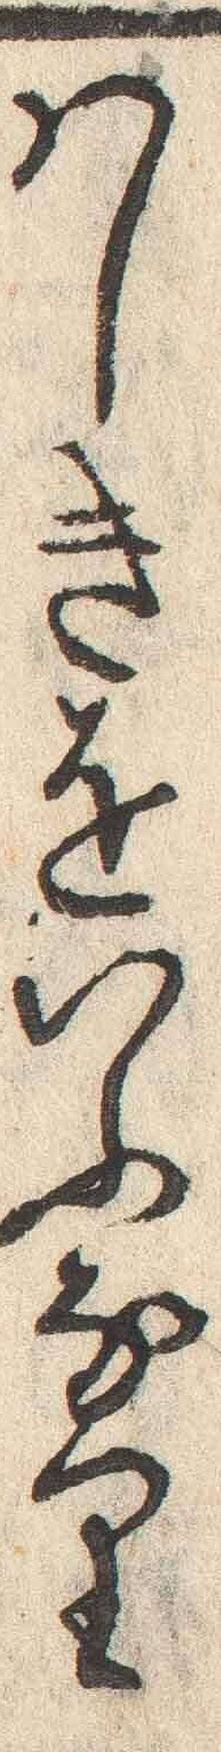はしきをいふなり
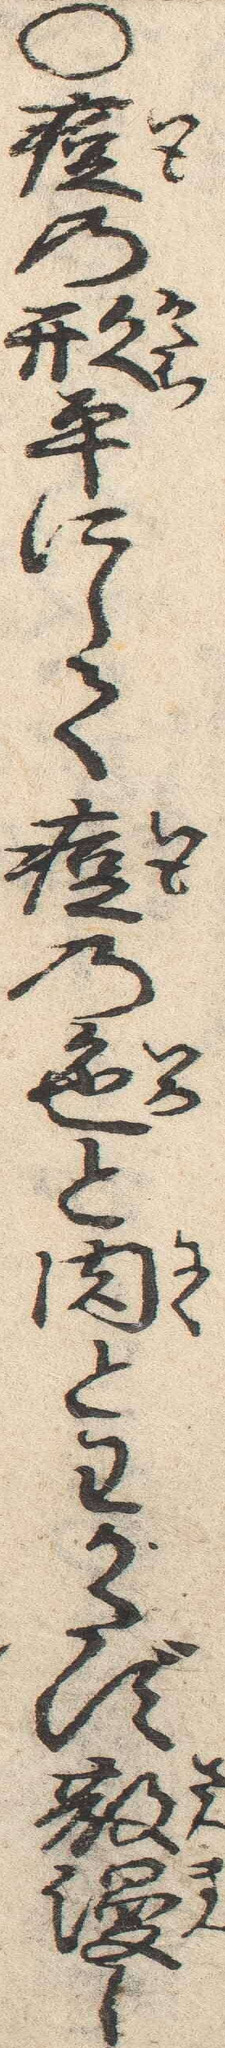○痘の形平にして痘の色と肉とわからず散漫し
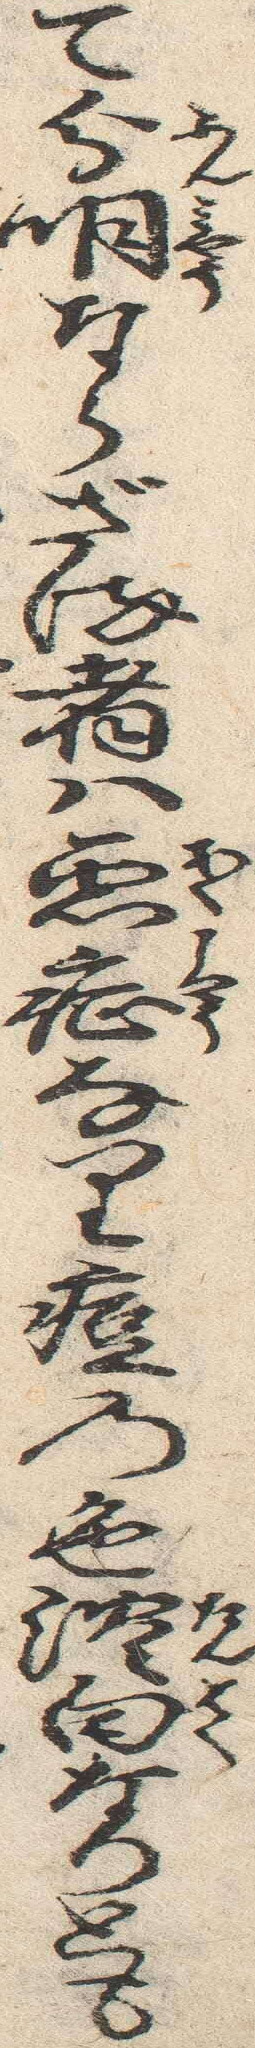て分明ならざる者は悪症なり痘の色淡白なりとも
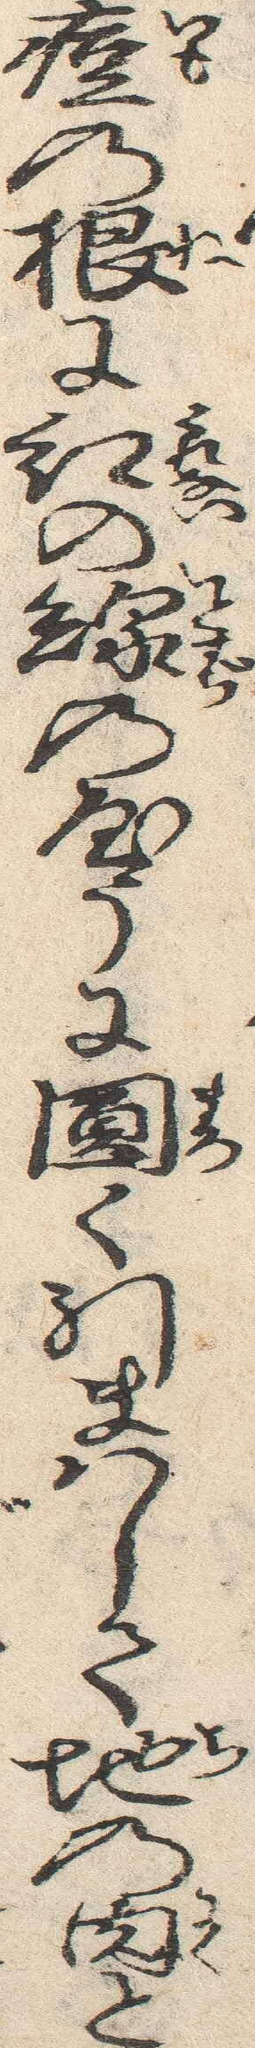痘の根に紅の線のやうに円く引まはして地の肉と
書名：小児必用養育草
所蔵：東京学芸大学附属図書館 国文学研究資料館
